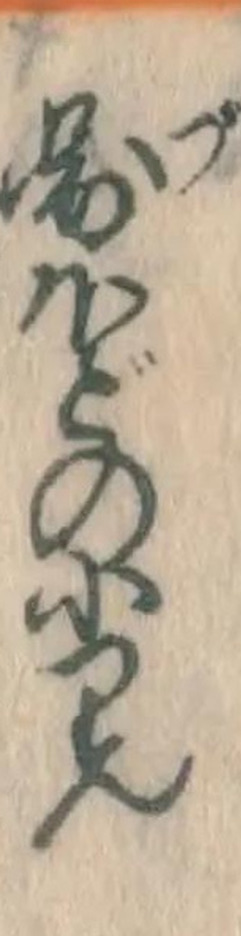図ほどの小りん
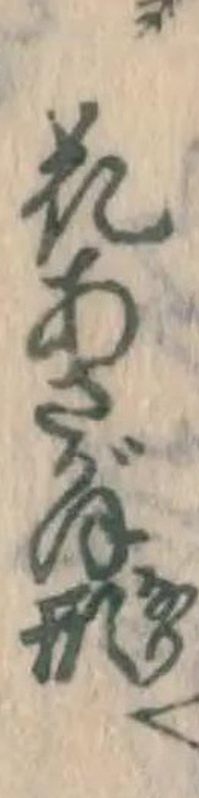花あさがほ形
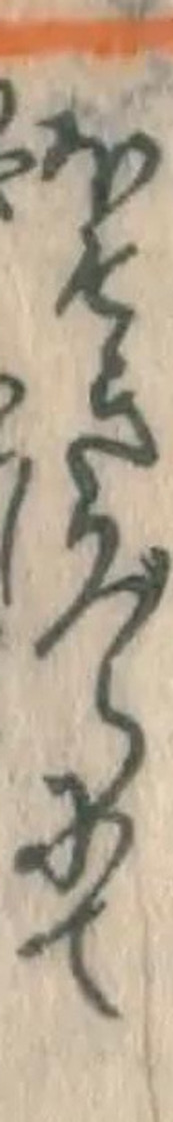ほそきかづらにて
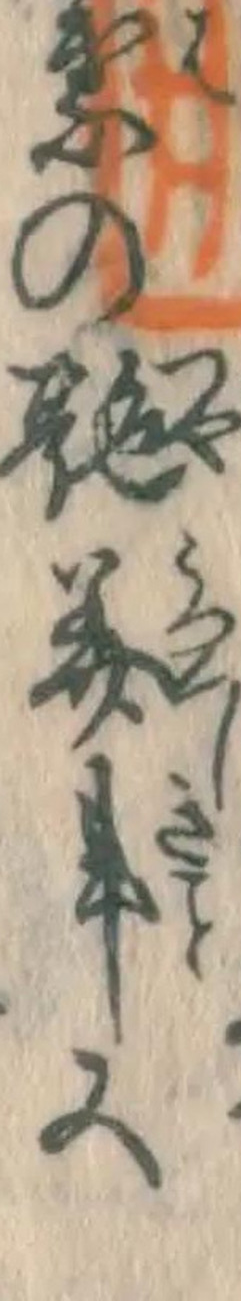葉の艶美事又
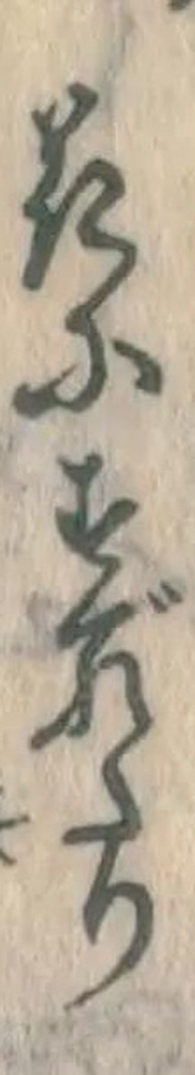花にすぐれたり

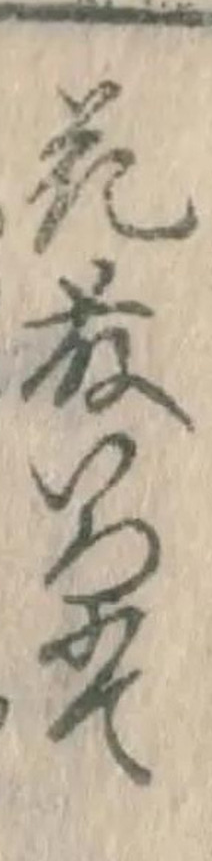花藤いろにて
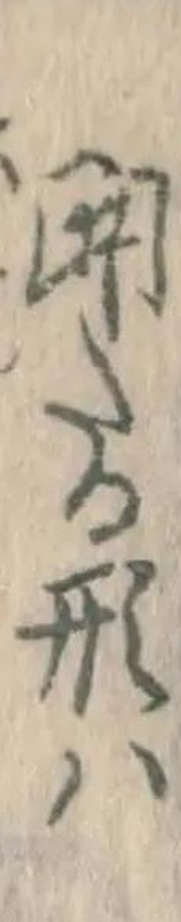開たる形は
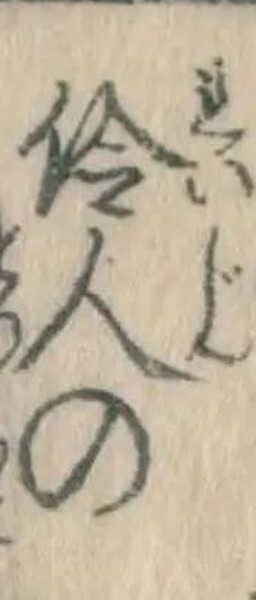伶人の
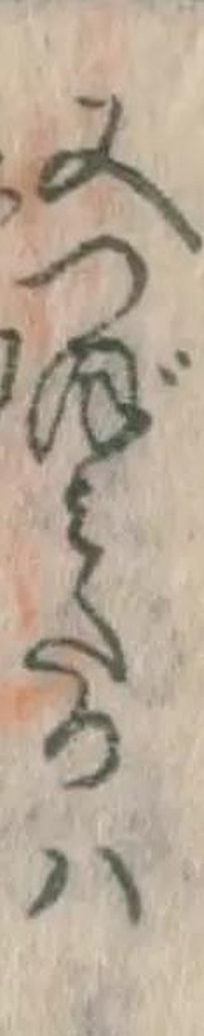又つぼみたるは
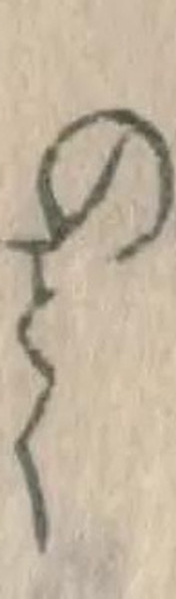のことく
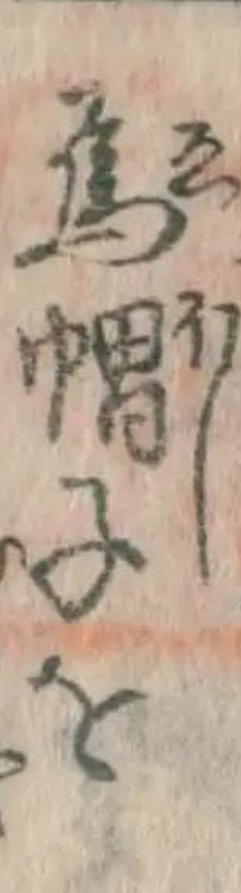烏帽子を
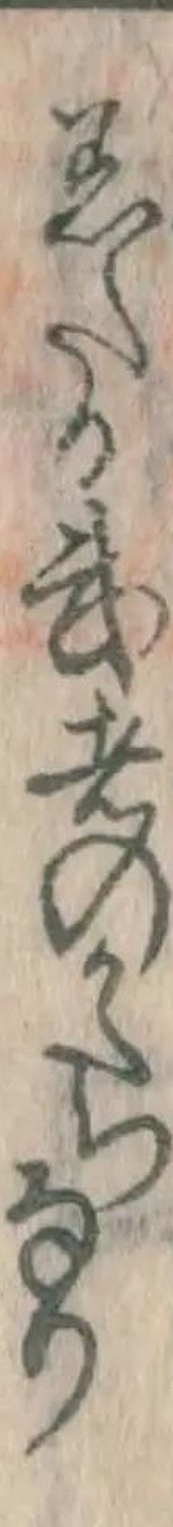着たる武者のかたちなり
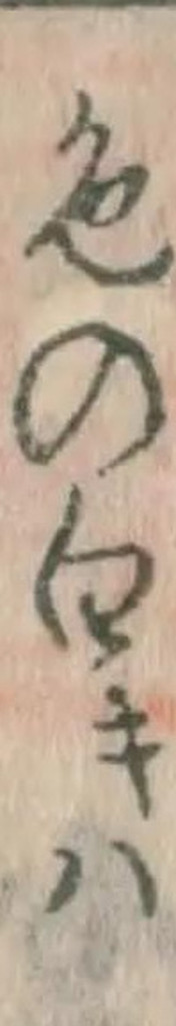色の白きは
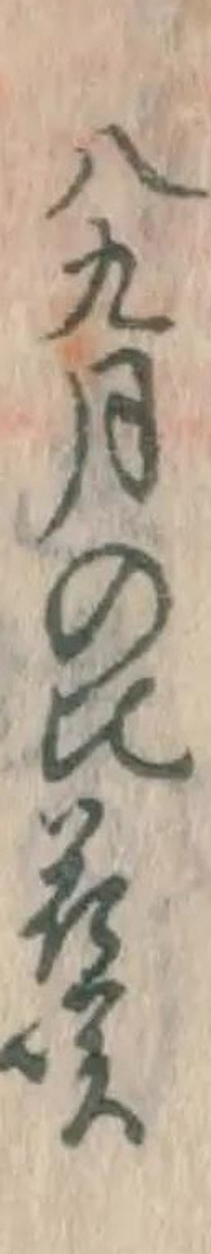八九月の比花咲
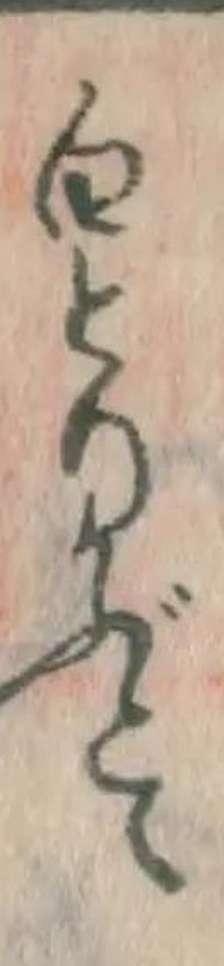白とりかぶとゝ
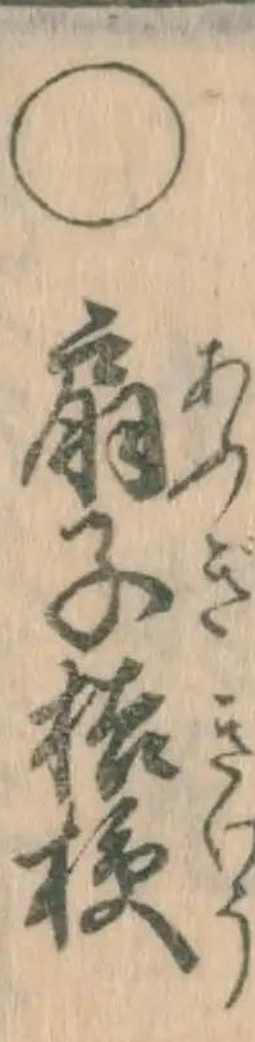〇扇子桔梗
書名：艸花繪前集. [3]
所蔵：国立国会図書館 National Diet Library, JAPAN
